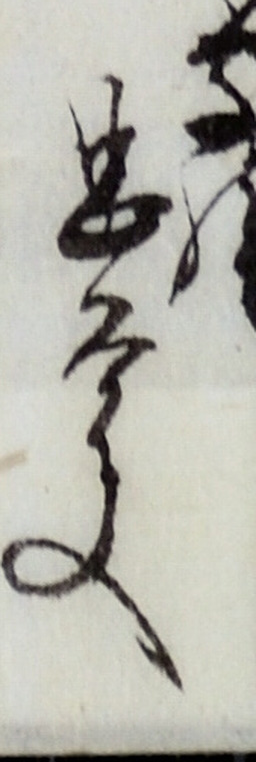忠太夫
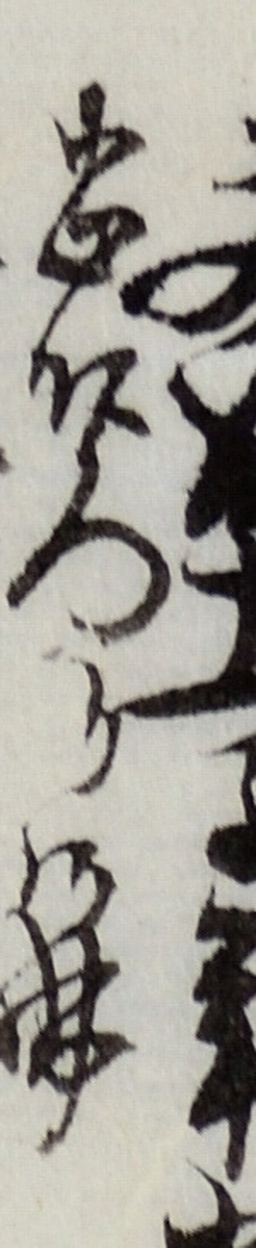忠左衛門
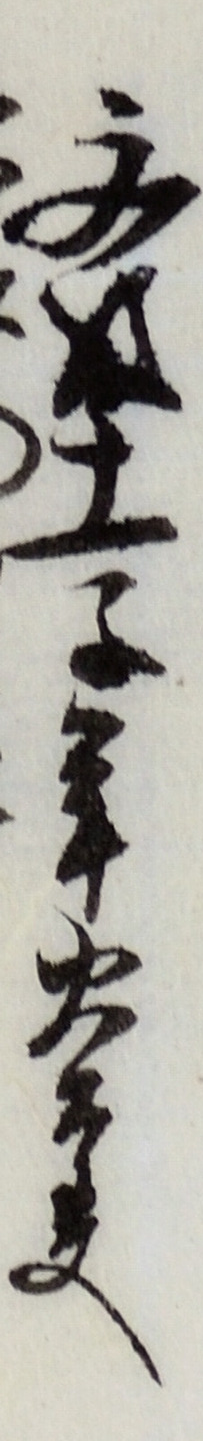文政十一子年忠太夫
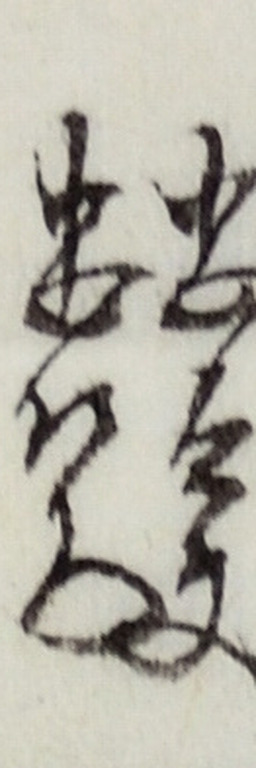忠左衛門
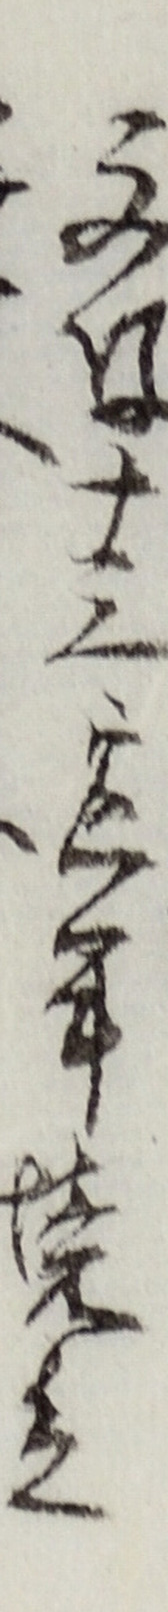文政十三寅年境立
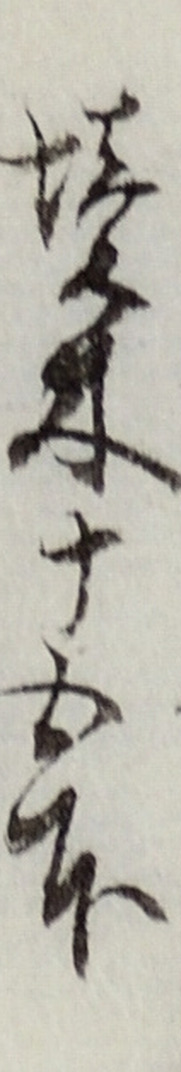境木十五本
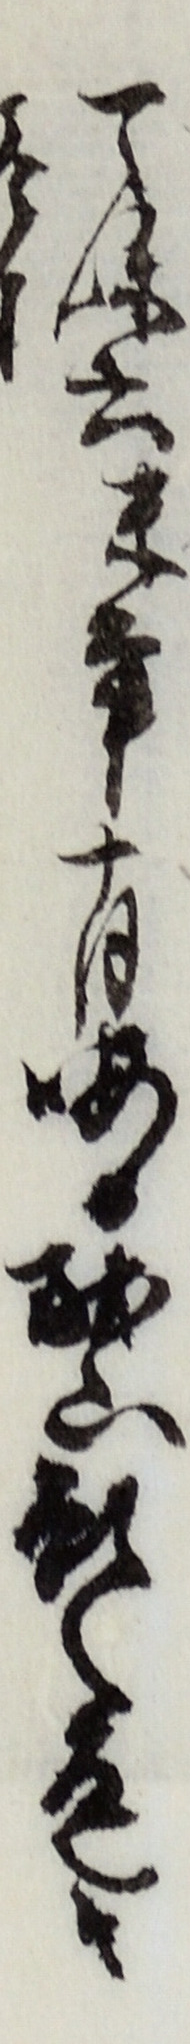天保六未年十月晦日献山願之通被
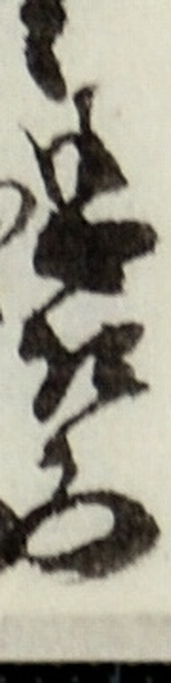忠左衛門
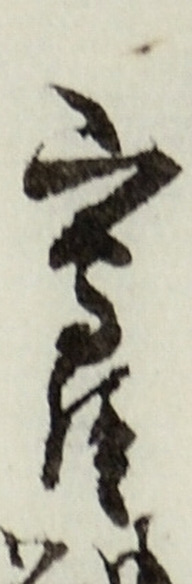山守請
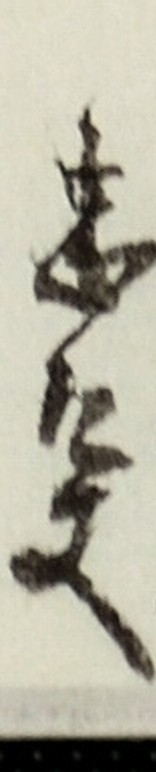忠太夫
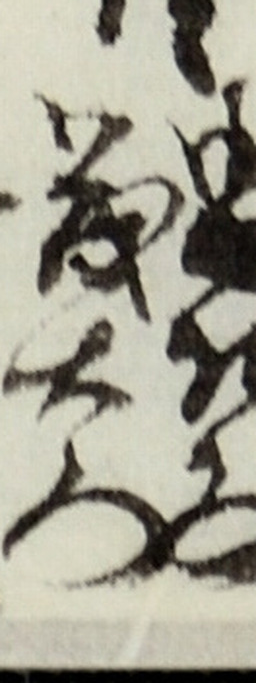茂右衛門
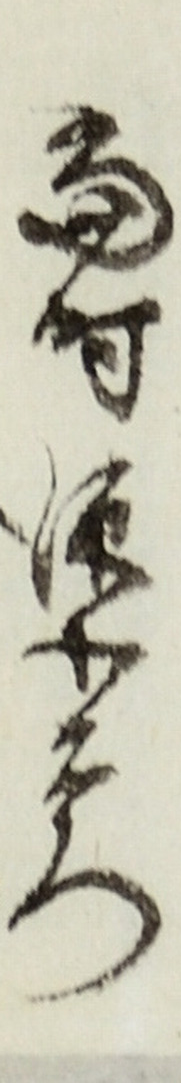当時源五右衛門
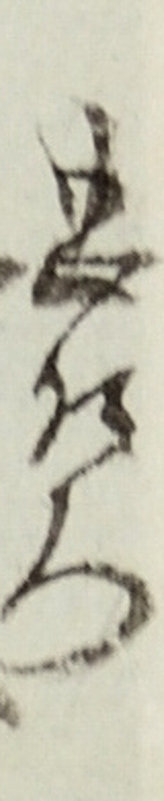忠左衛門
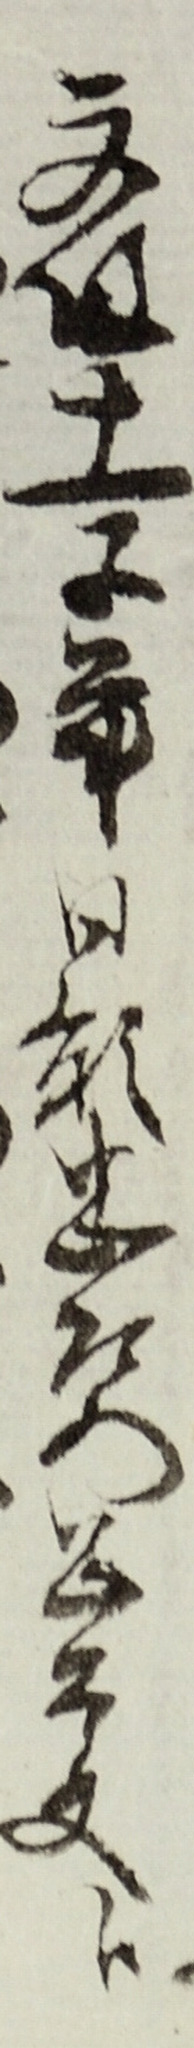文政十一子年日影忠左衛門忠太夫え
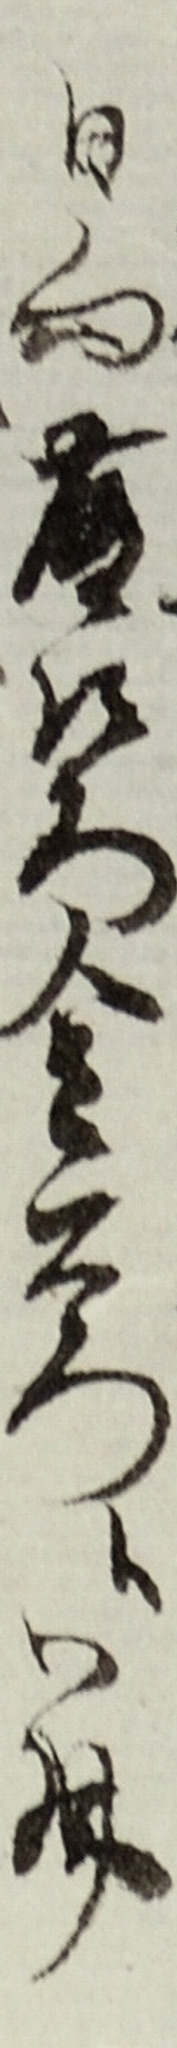日向藤左衛門金右衛門え御払
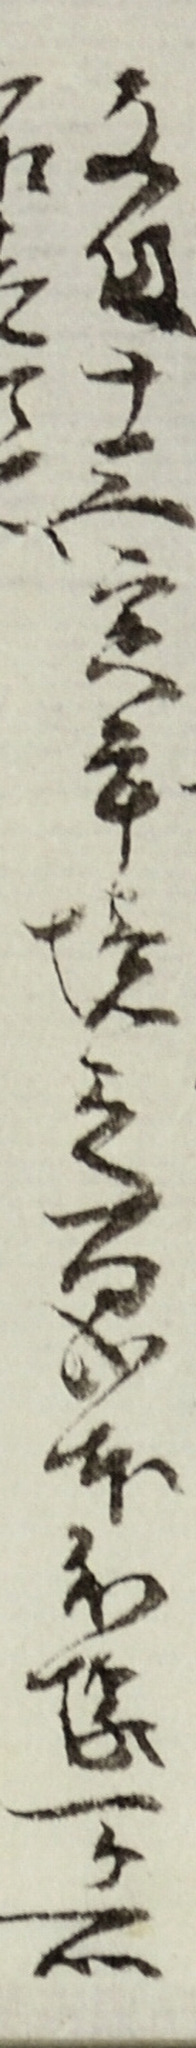文政十三寅年境立百弐本外塚一ケ所
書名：山林帳草稿
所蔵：伊那市立高遠町図書館・合同会社AMANE
